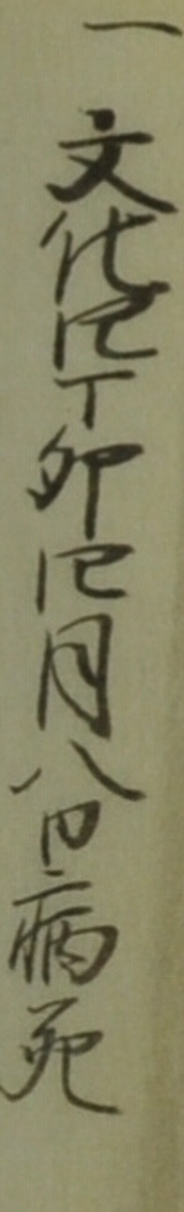一文化四丁卯四月八日病死
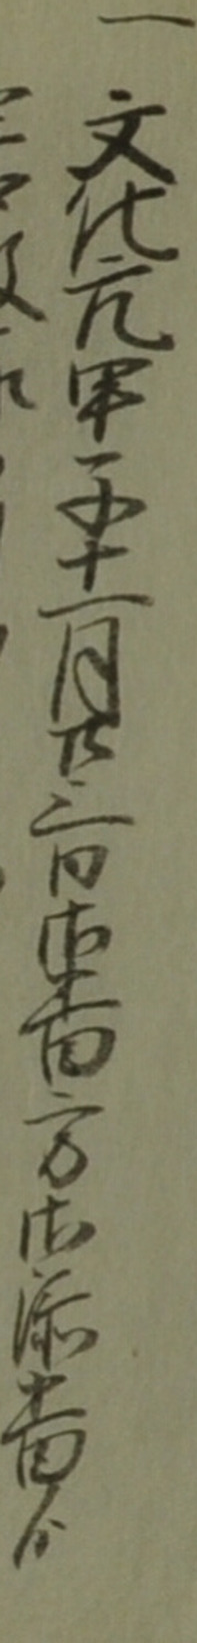一文化元甲子十一月廿三日御番方御添番ゟ
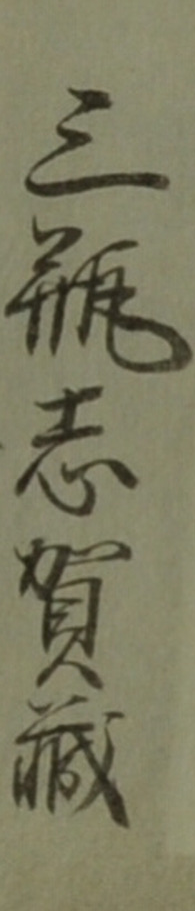三瓶志賀蔵
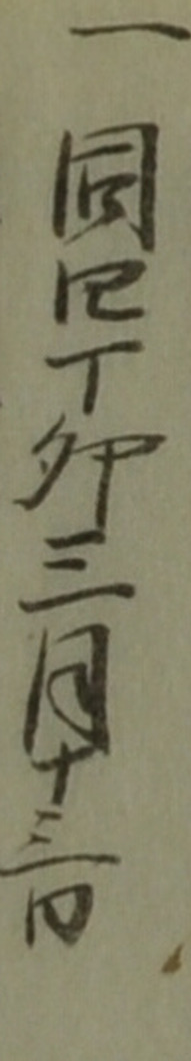一同四丁卯三月十三日
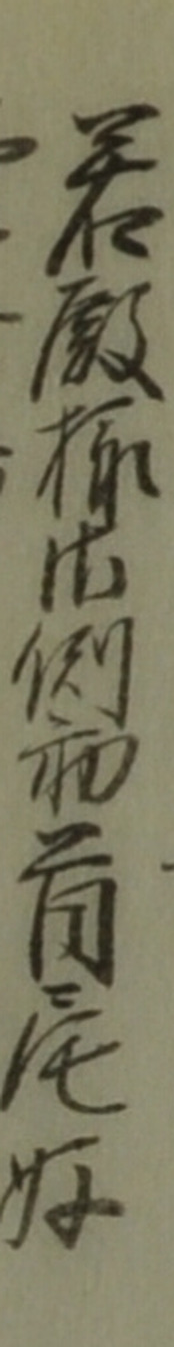若殿様御側勤首尾好
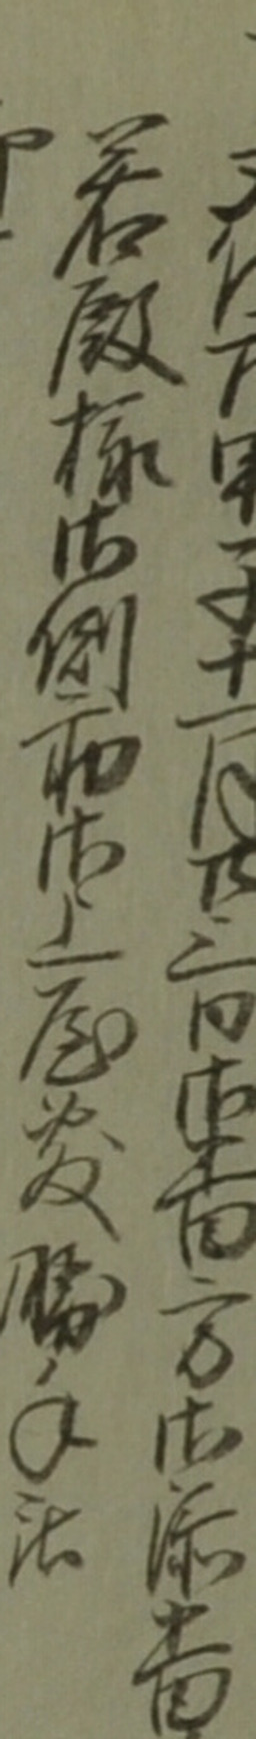若殿様御側勤御上屋敷勝手被
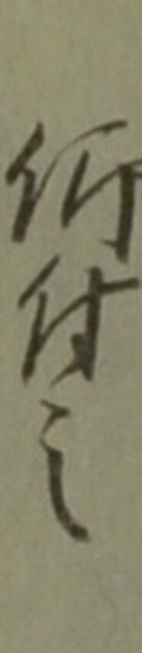仰付之
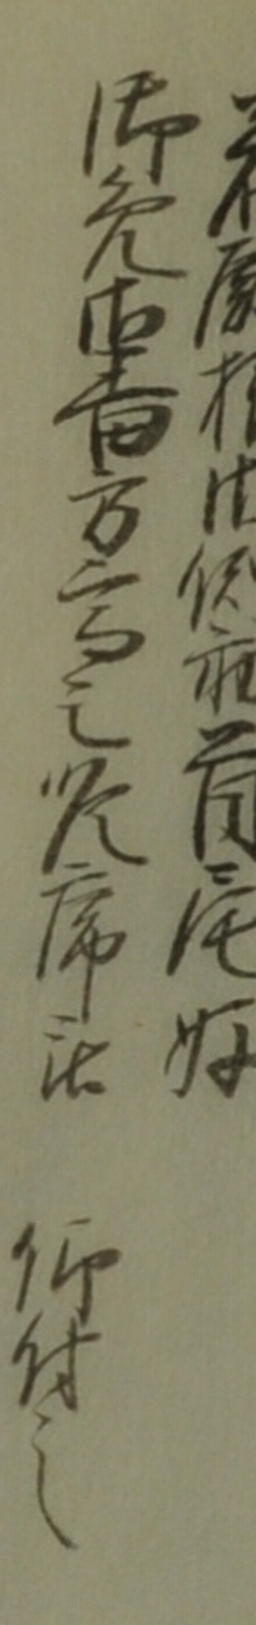御免御番方高之順席被仰付之
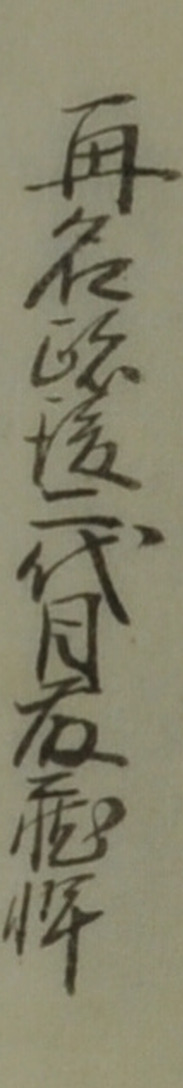再名跡後二代目藤蔵忰
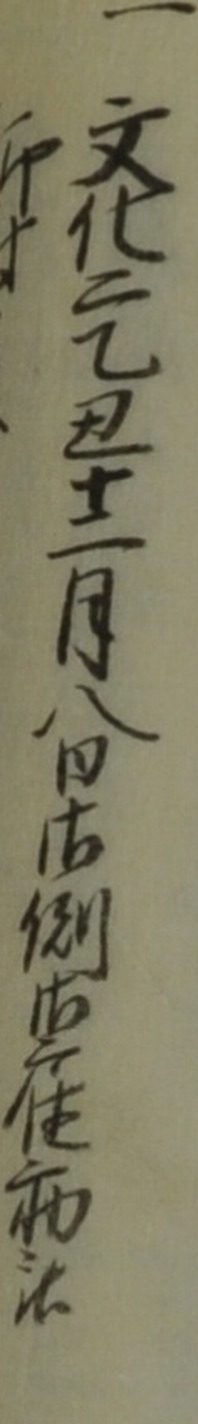一文化二乙丑十二月八日御側御雇勤被
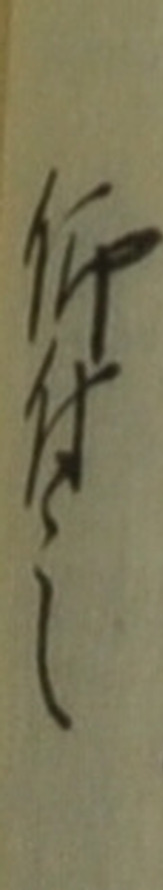仰付之
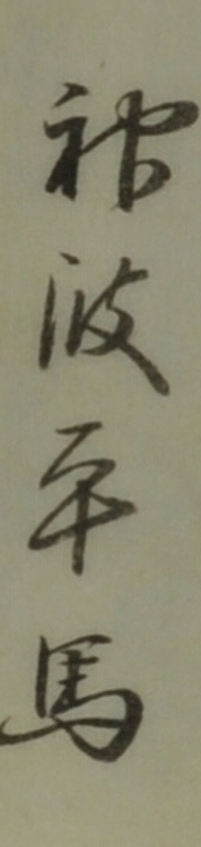神波平馬
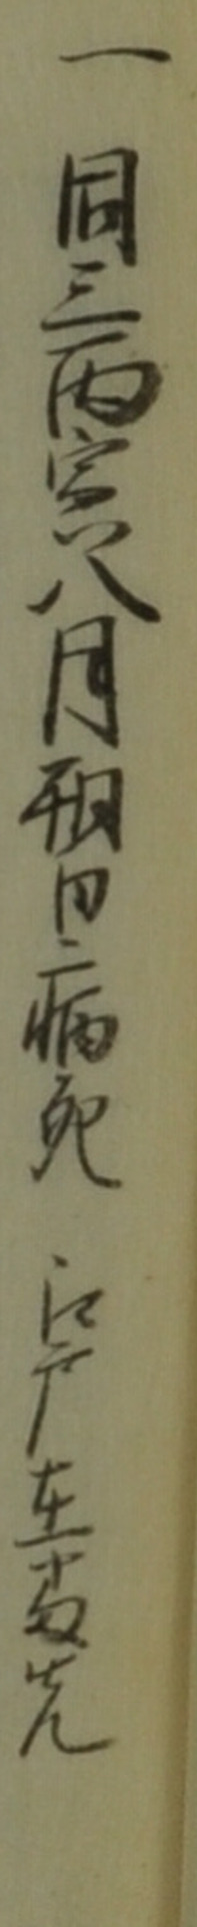一同三丙寅八月朔日病死江戸在番先
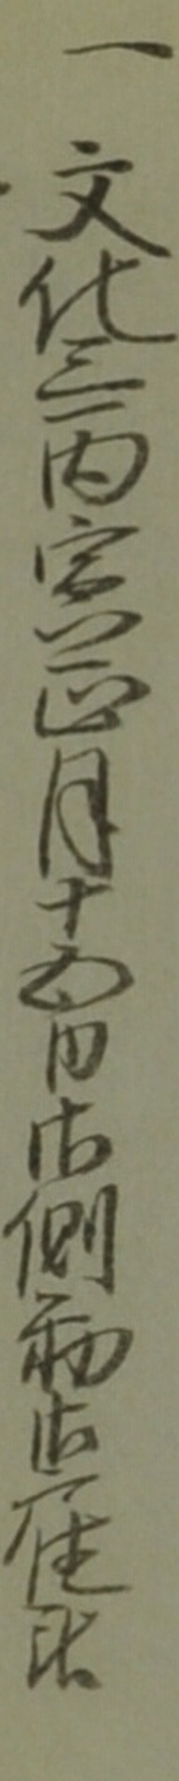一文化三丙寅正月十五日御側勤御雇被
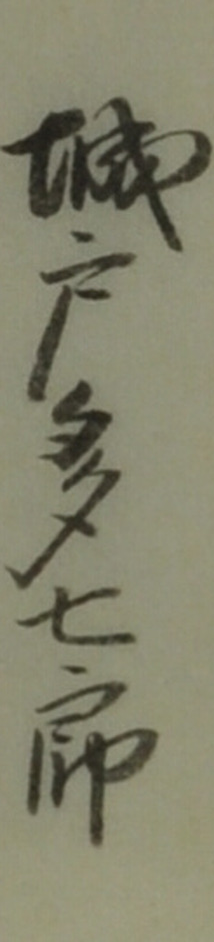城戸多七郎
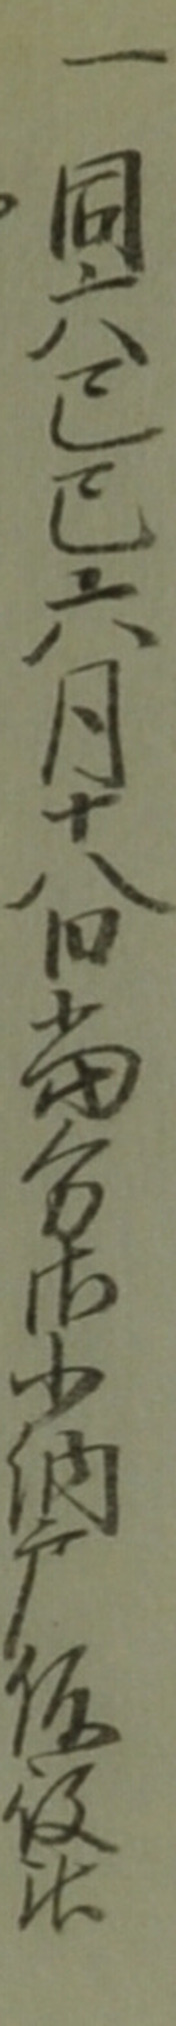一同六己巳六月十八日当分御小納戸仮役被
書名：諸御役代々録（五）
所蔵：伊那市立高遠町図書館・合同会社AMANE
